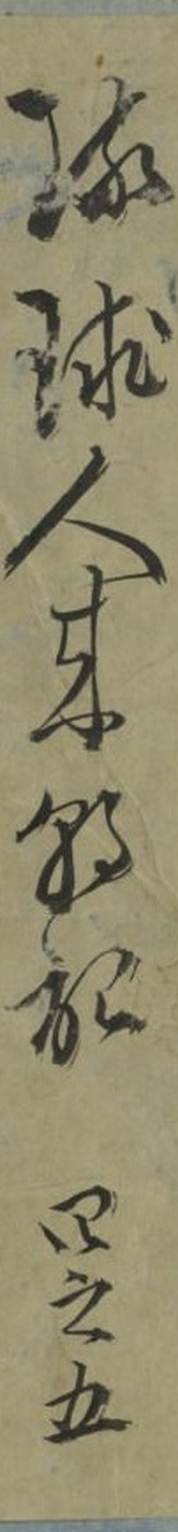琉球人来朝記四之五

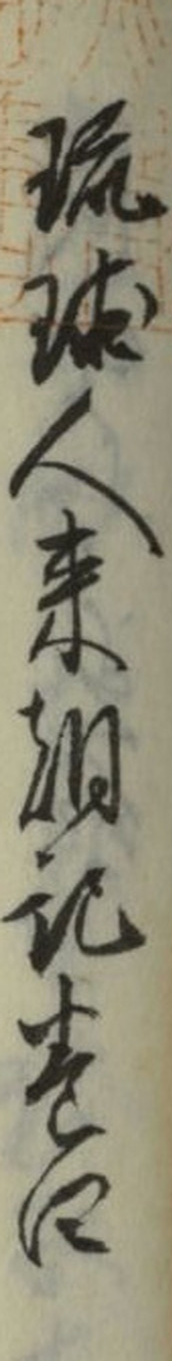琉球人来朝記巻四
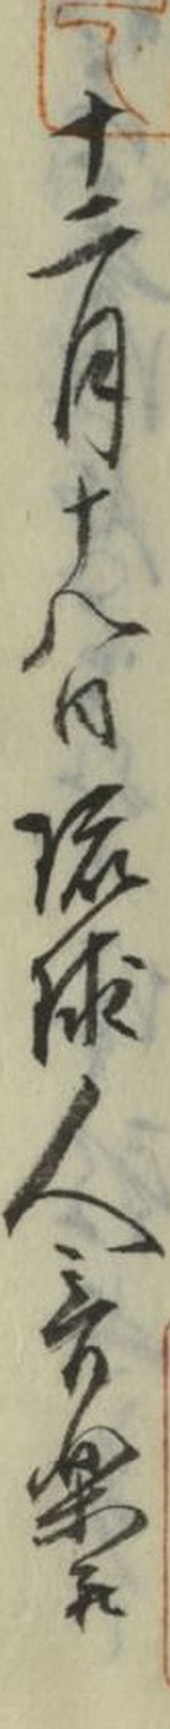十二月十八日琉球人音楽幷
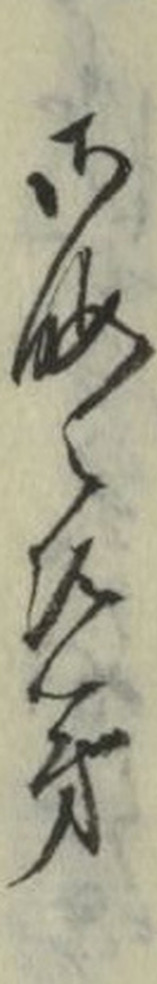御暇之次第
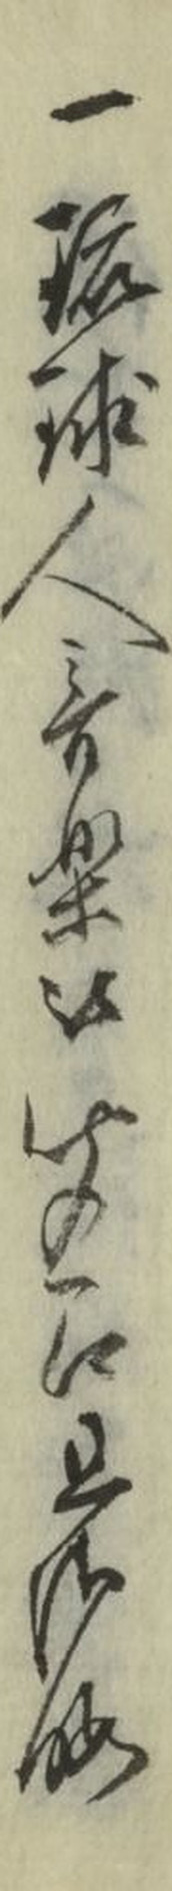一琉球人音楽被聞召且御暇
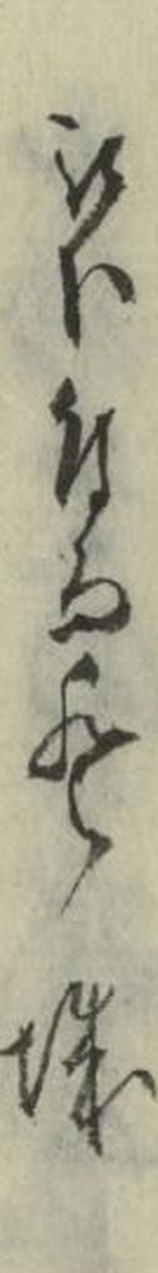被下付而登城
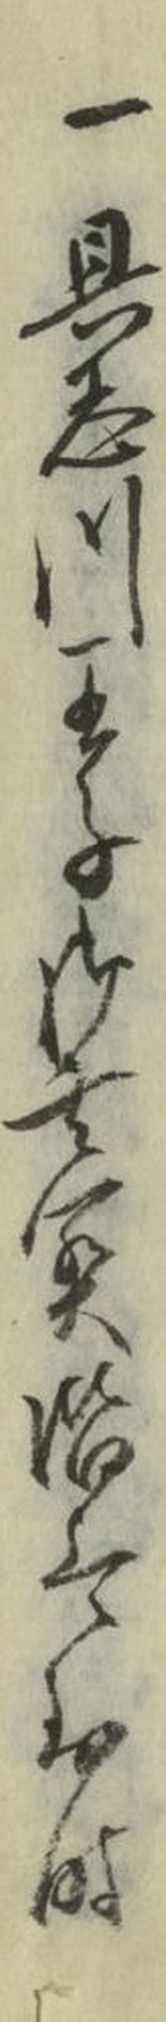一具志川王子御玄関階上に到時

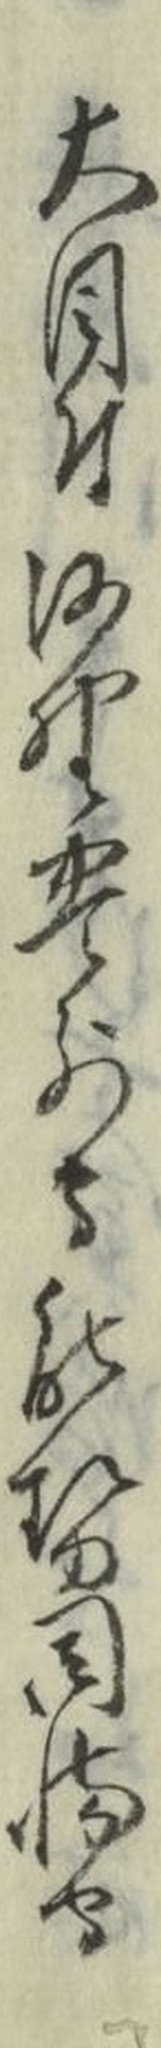大目付河野豊前守能勢因幡守
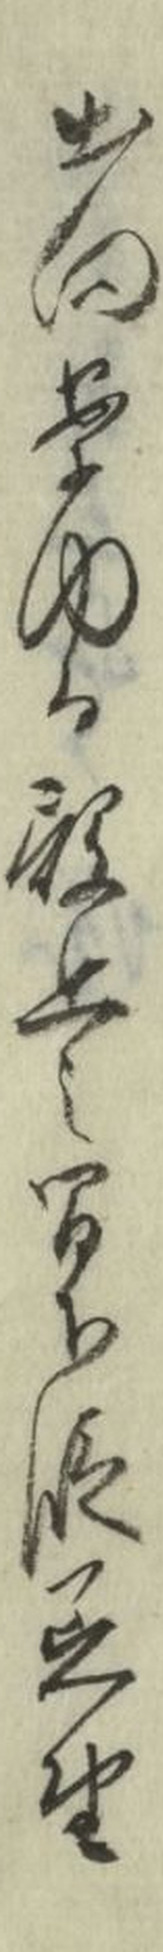出向案内而殿上之間下段着坐
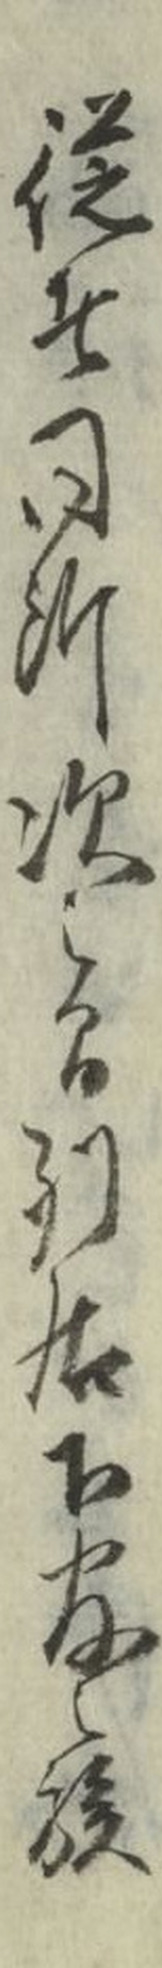従者同所次之間列居下官之族
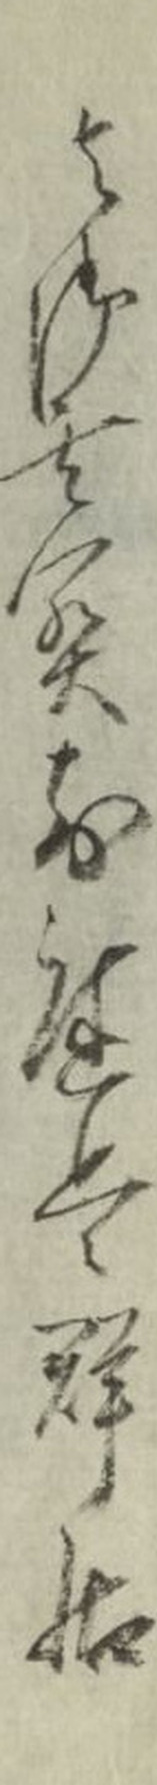は御玄関前庭上に群居
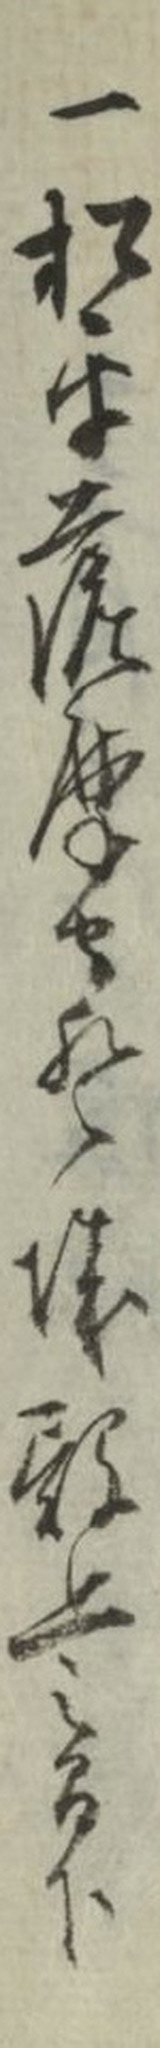一松平薩摩守登城殿上之間下
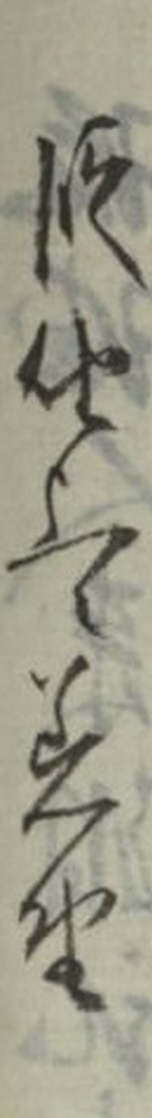段坐上に着坐
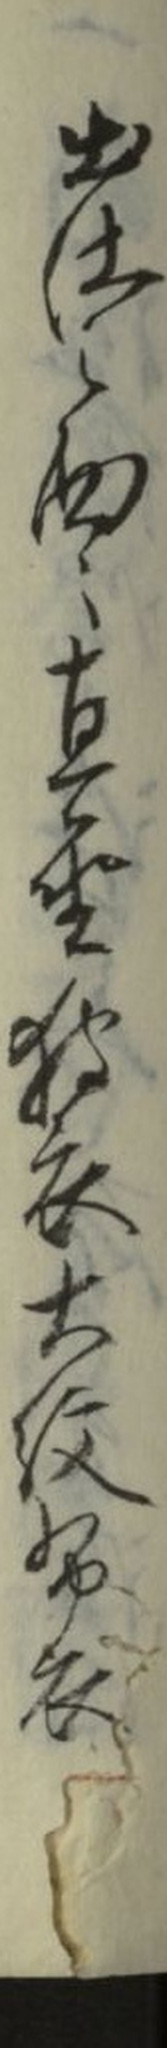一出仕之面々直垂狩衣大紋布衣
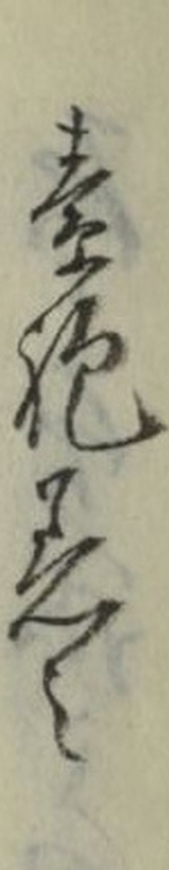素袍着之
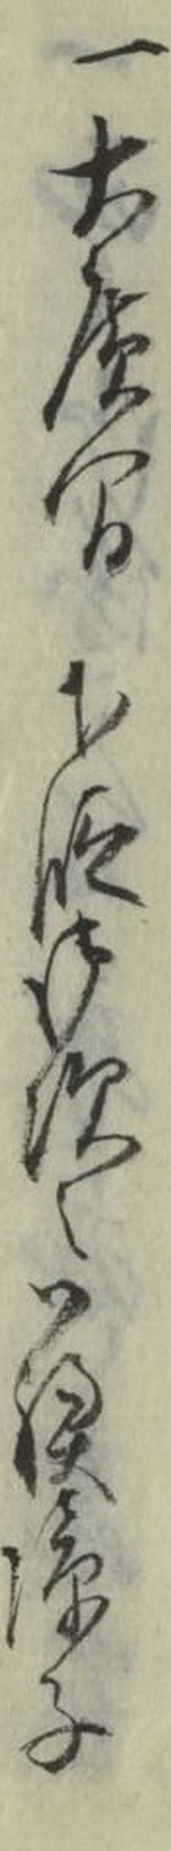一大広間下段御次之御襖障子
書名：琉球人来朝記 四之五
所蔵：University of the Ryukyus Library
